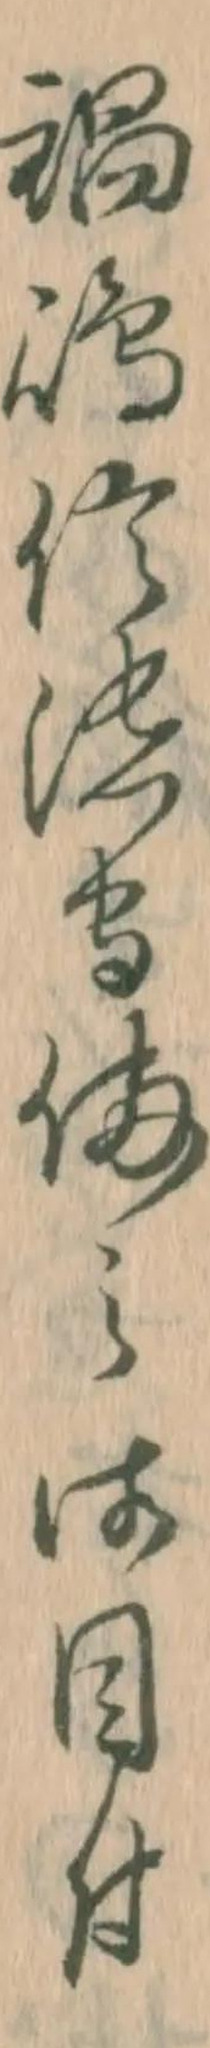鍋島信濃守備之御目付
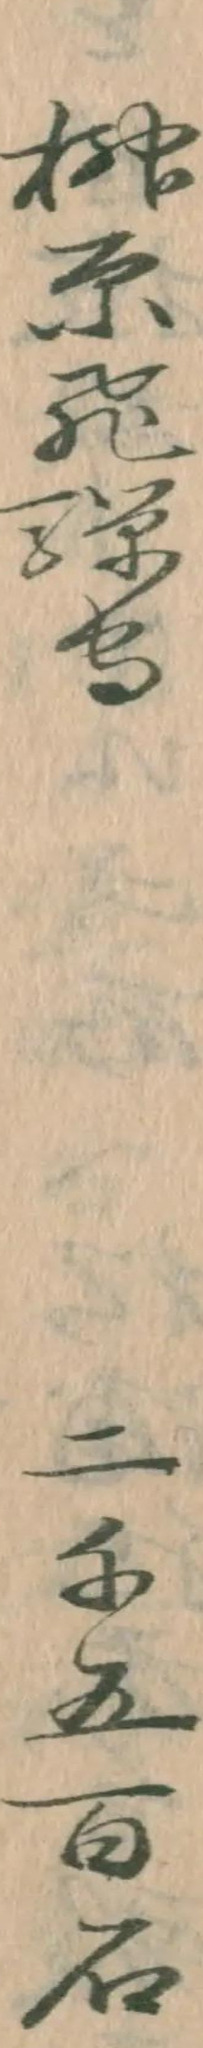榊原飛騨守二千五百石
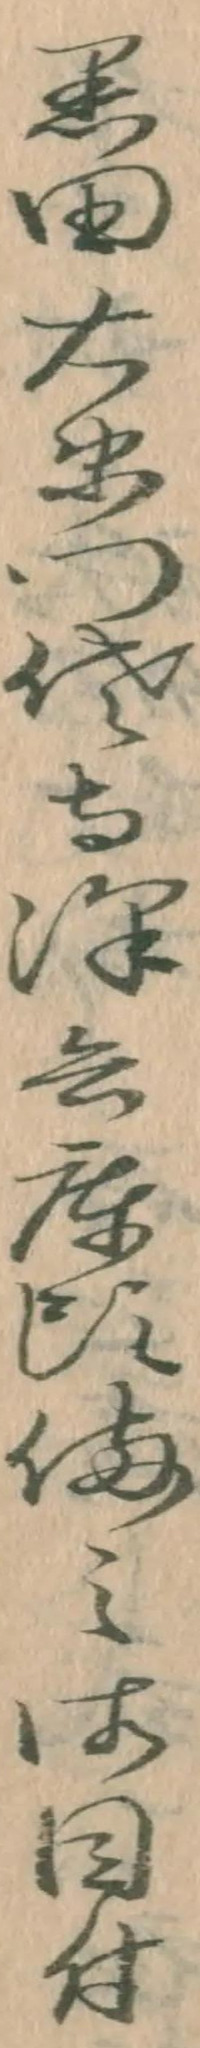黒田右衛門佐寺沢兵庫頭備之御目付
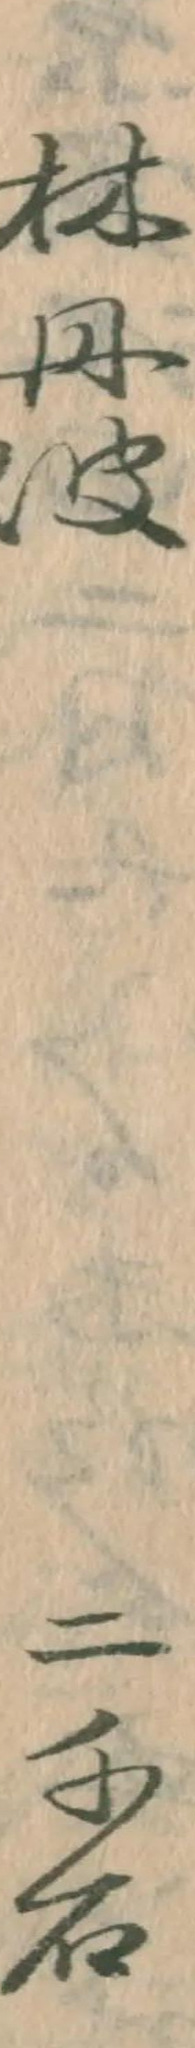林丹波二千石
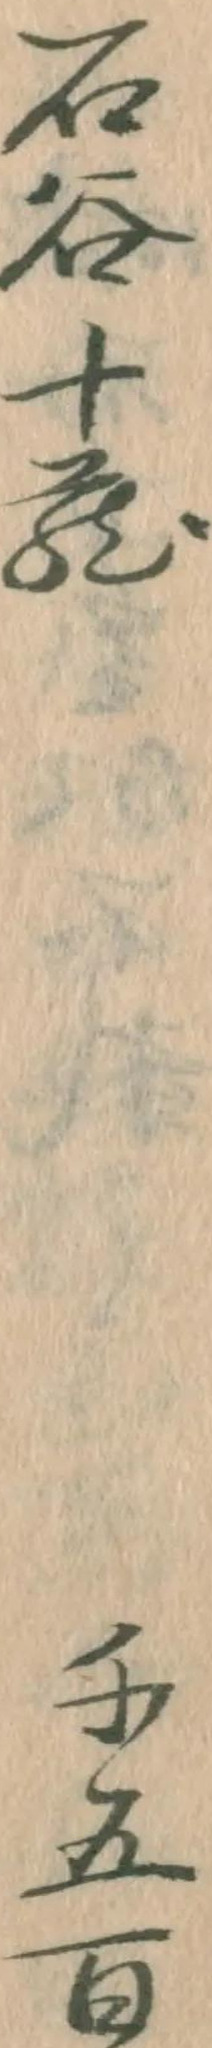石谷十蔵千五百石
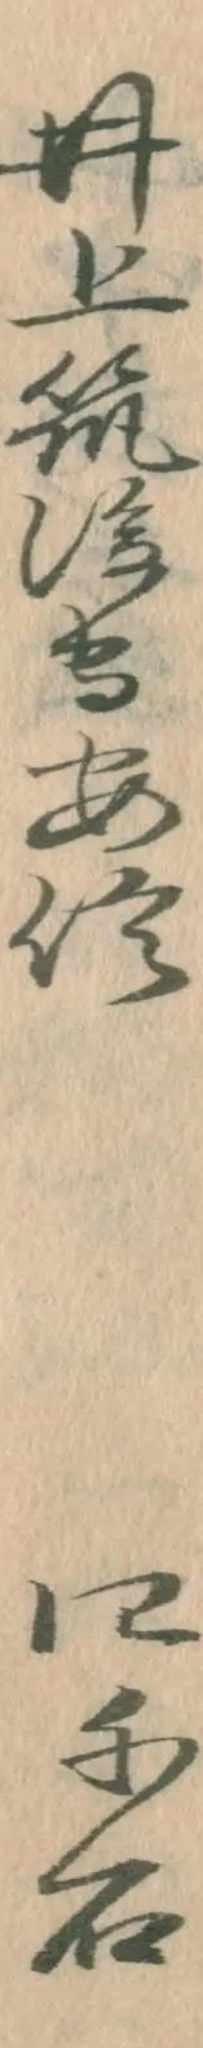井上筑後守安信四千石
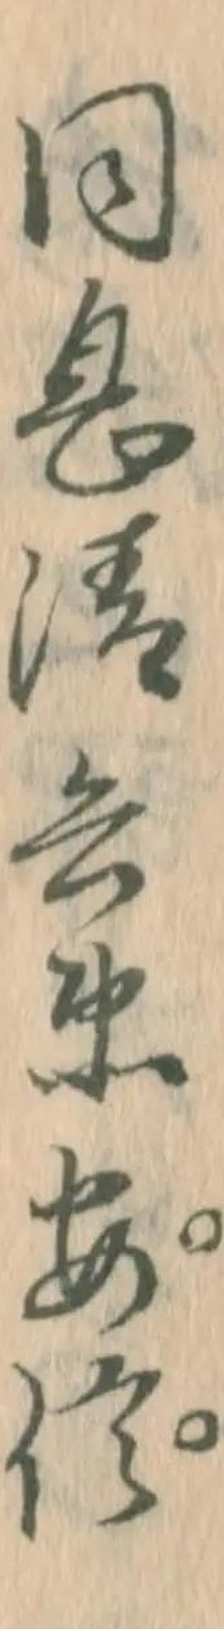同則清兵衛安信
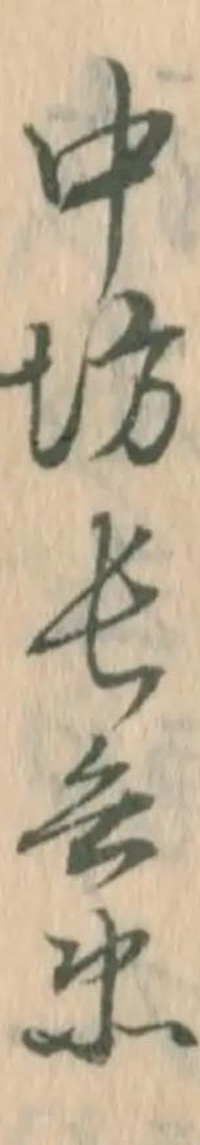中坊長兵衛

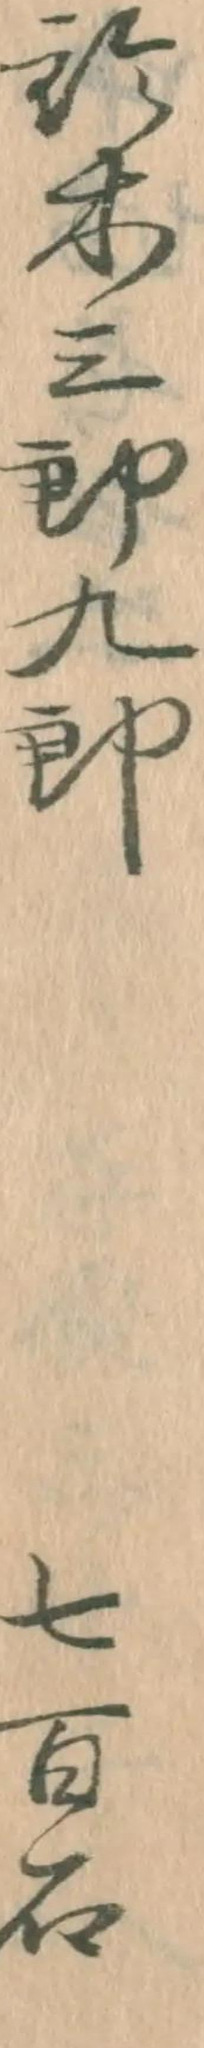鈴木三郎九郎七百石
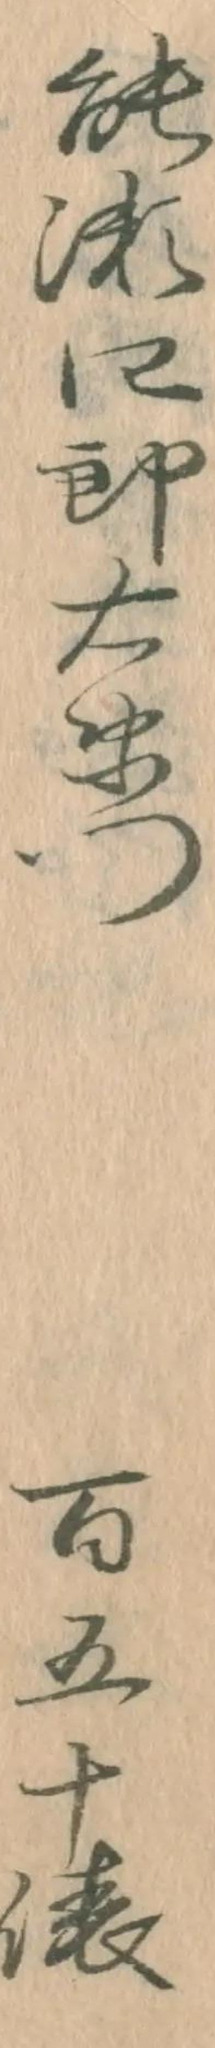能瀬四郎右衛門百五十俵
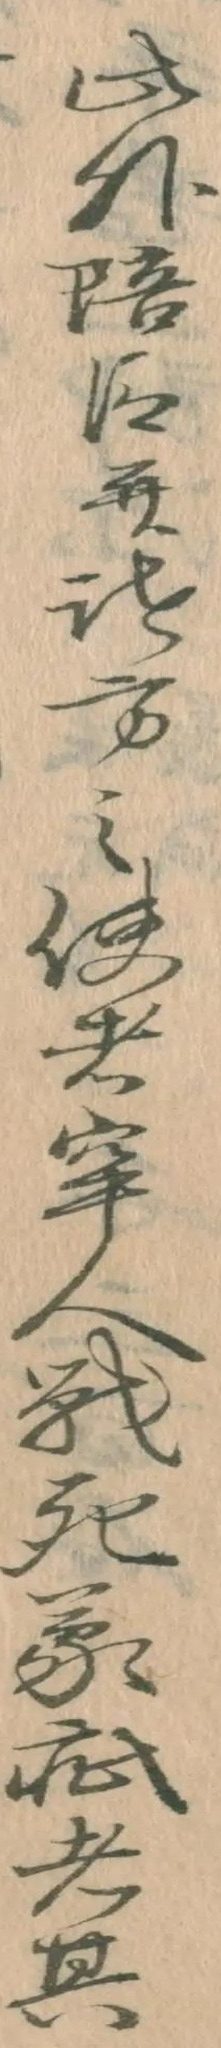此外陪臣幷諸方之使者牢人戦死承疵者共
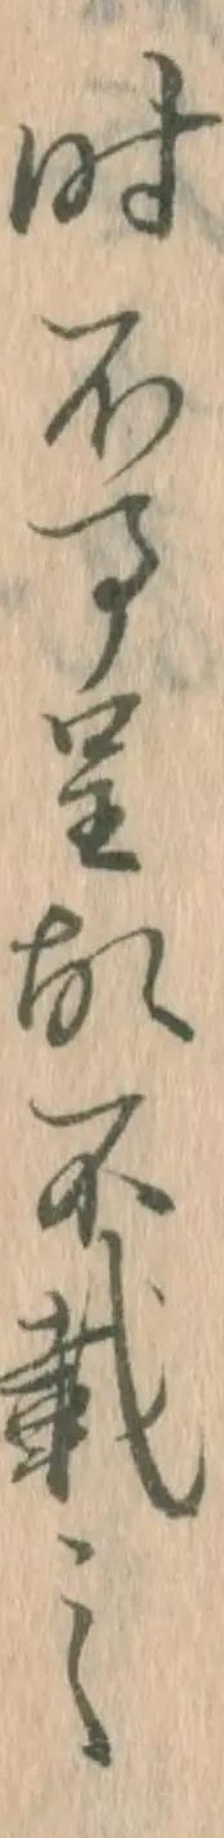時不事呈故不載之
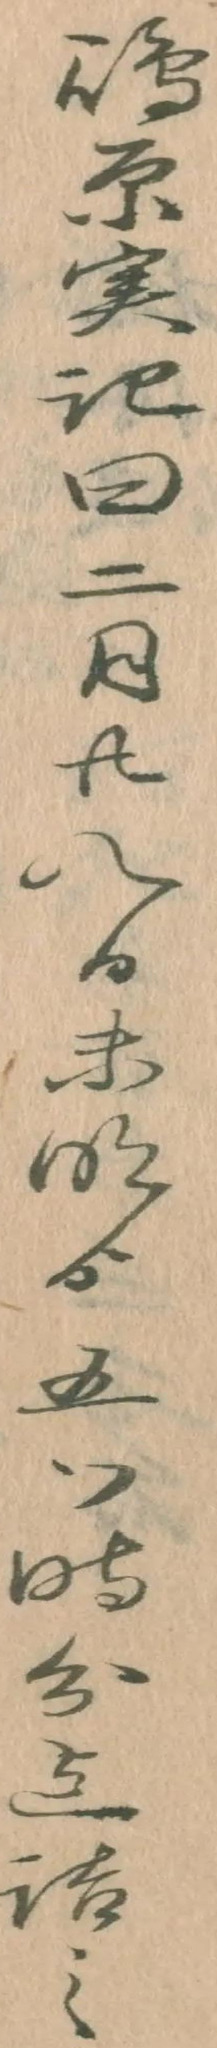島原実記曰二月廿八日未明ゟ五つ時分迄詰之
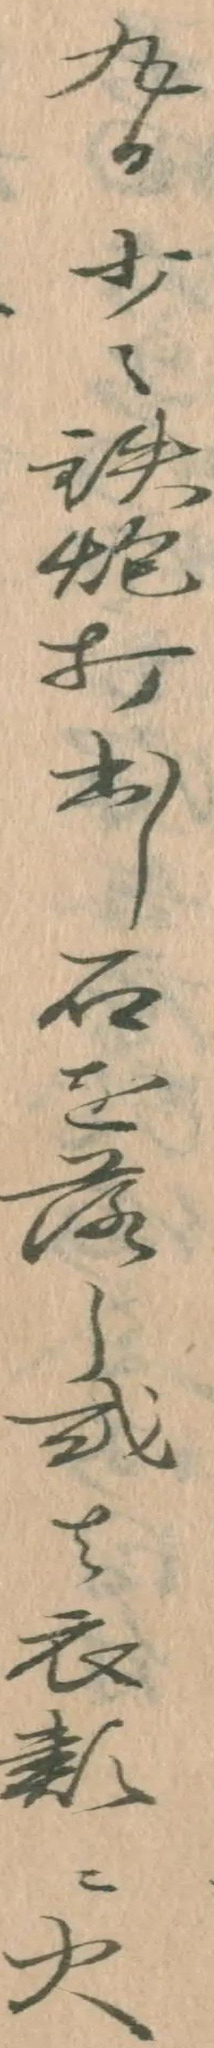丸る少々鉄砲打出し石を落し或者衣類に火
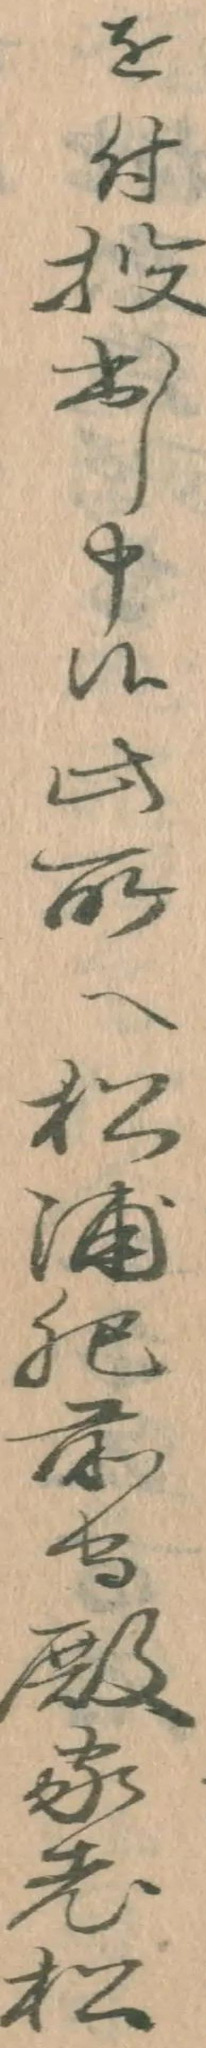を付投出し申候此所へ松浦肥前守殿家老松
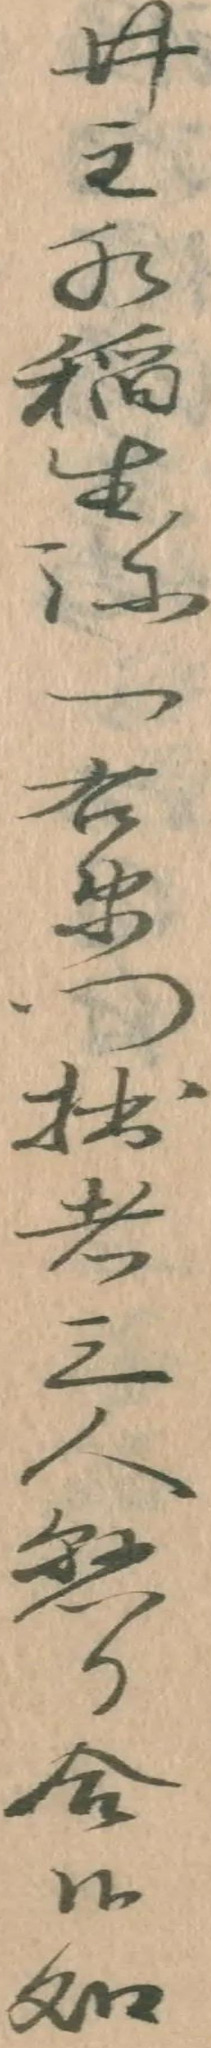井主水稲生弥一右衛門拙者三人懸り合候処
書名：切支丹御退治記 49巻. [9]
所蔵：国立国会図書館 National Diet Library, JAPAN
